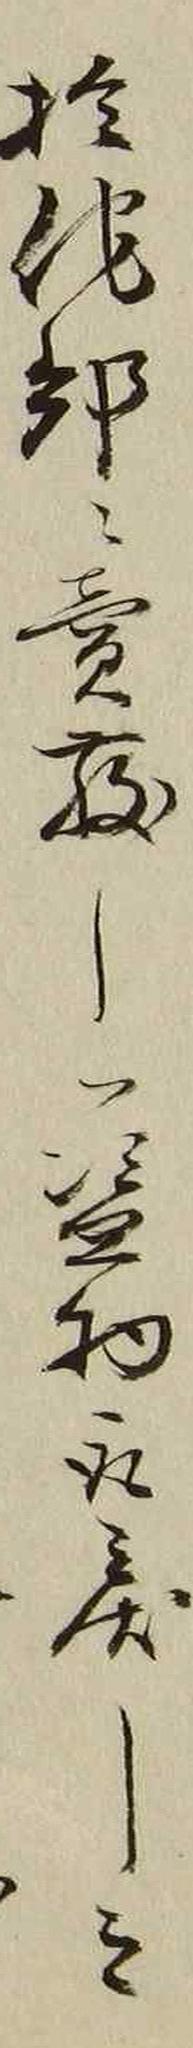於他邦ニ売散し候盗物取戻し之
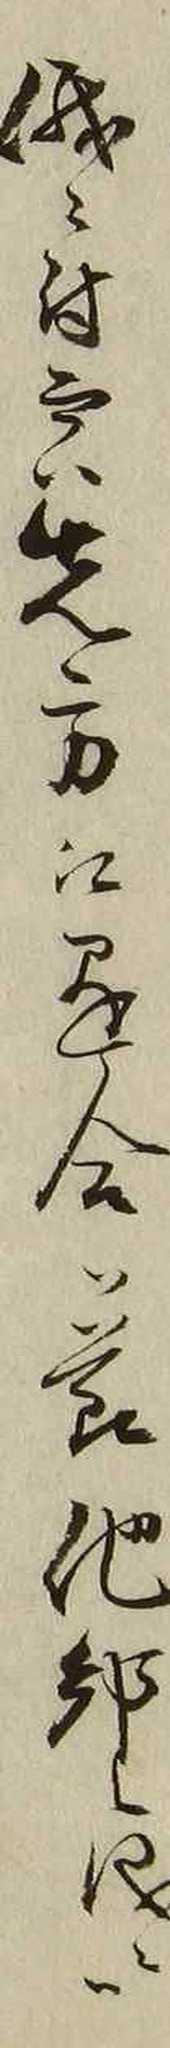儀ニ付而ハ先方江懸合候節他邦之儀ニ候
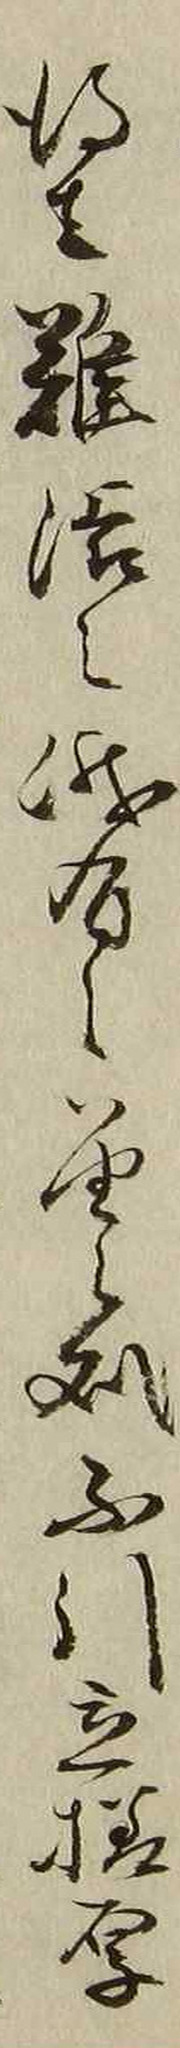得者難渋之儀有之候由之処不引立様厚
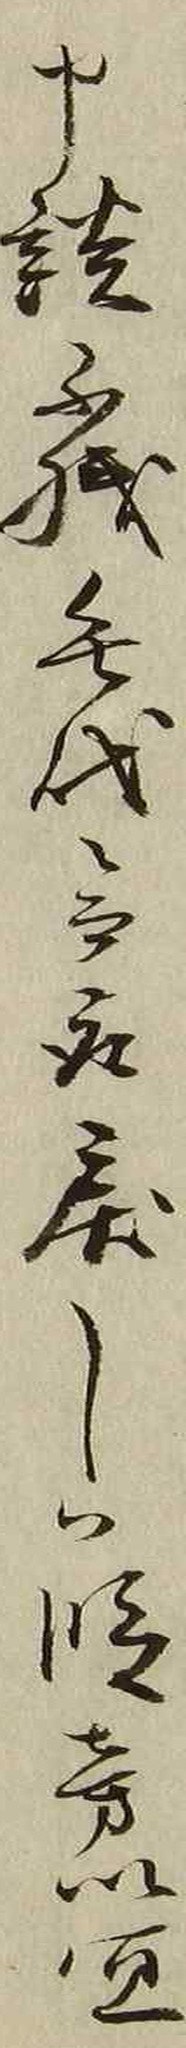申談不残無代ニ而取戻し候段旁以宜
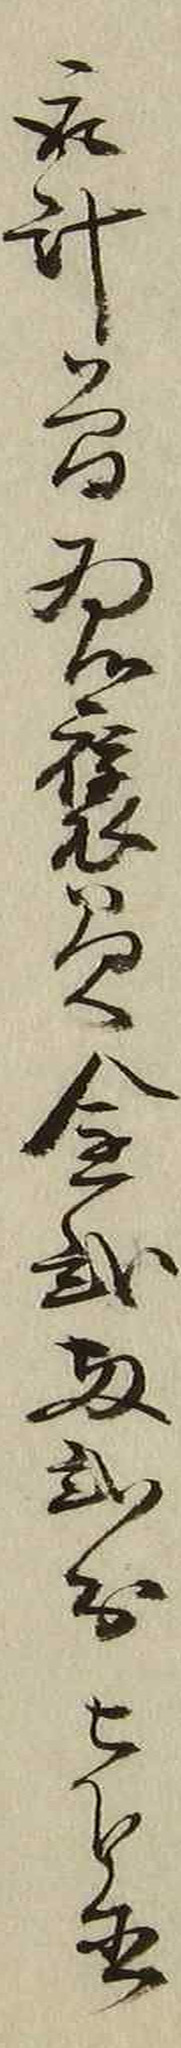取計候間為御褒美金弐両弐分被下置
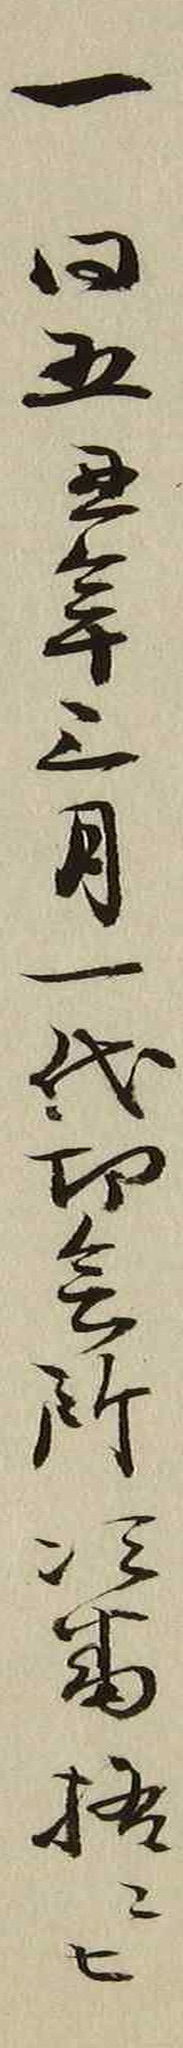一同五丑年三月一代切会所次番格ニ被
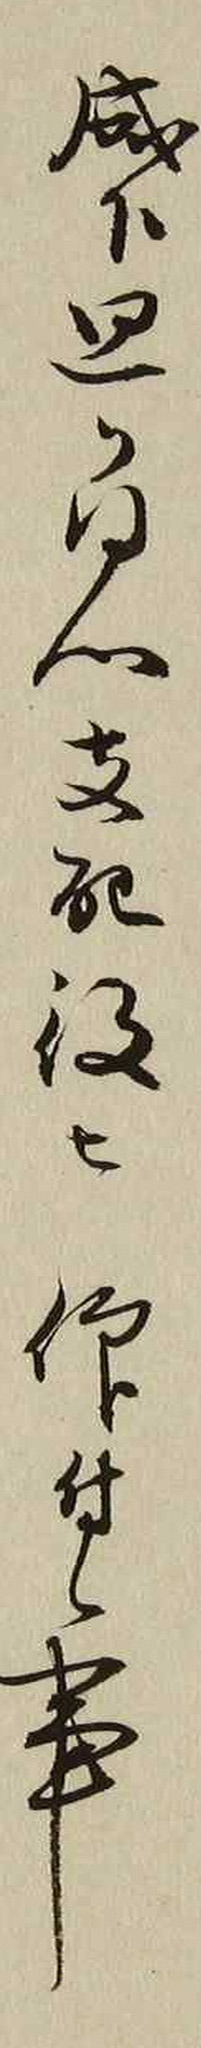成下廻り同心支配役被仰付候事
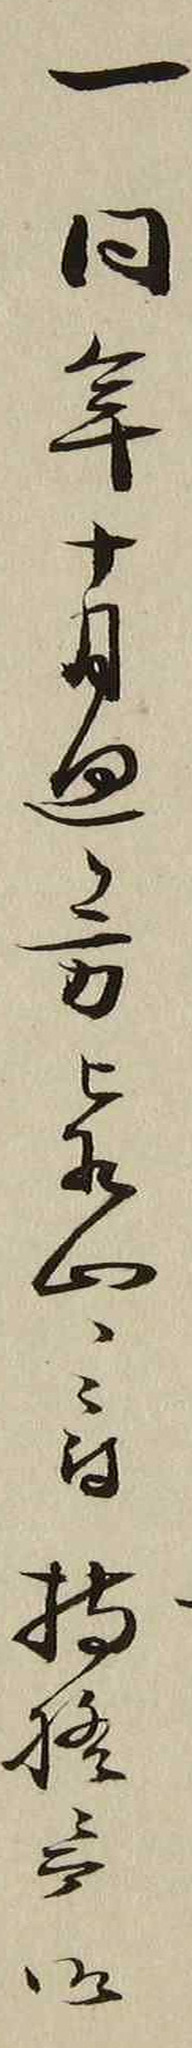一同年十月廻り方被相止候ニ付持格ニ而御
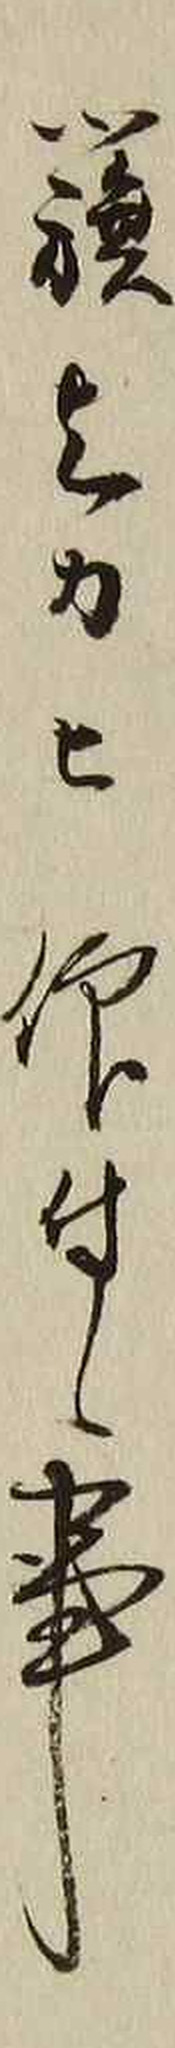籏与力被仰付候事
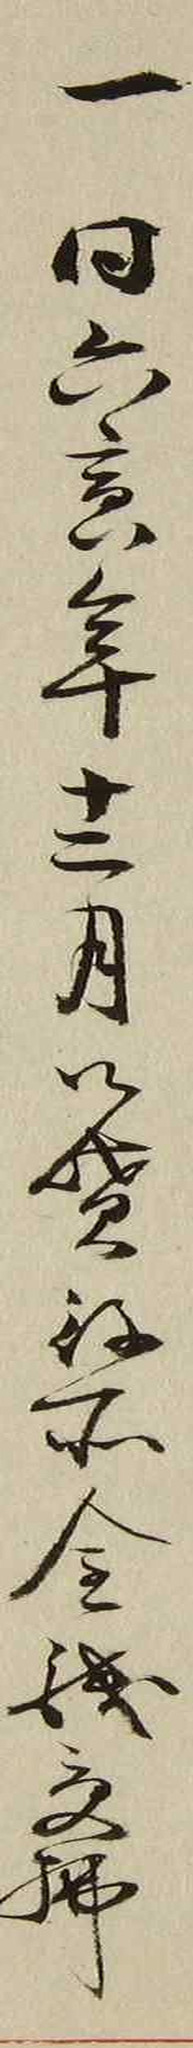一同六寅年十二月御貸役所金銭受払
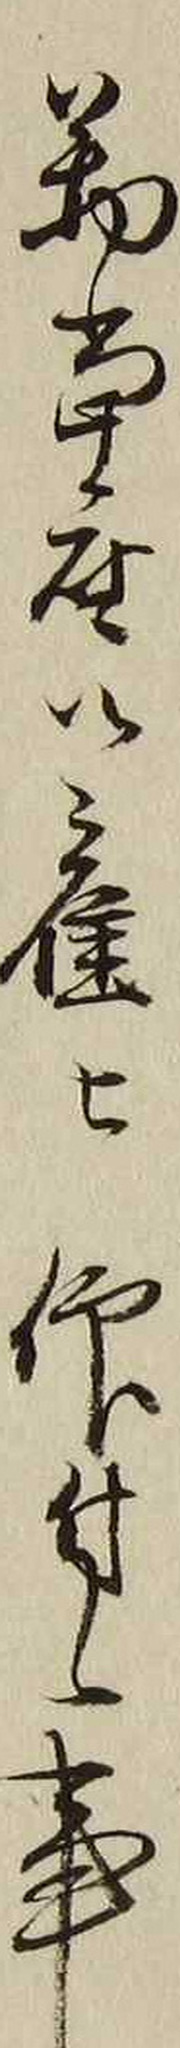勤当座御雇被仰付候事
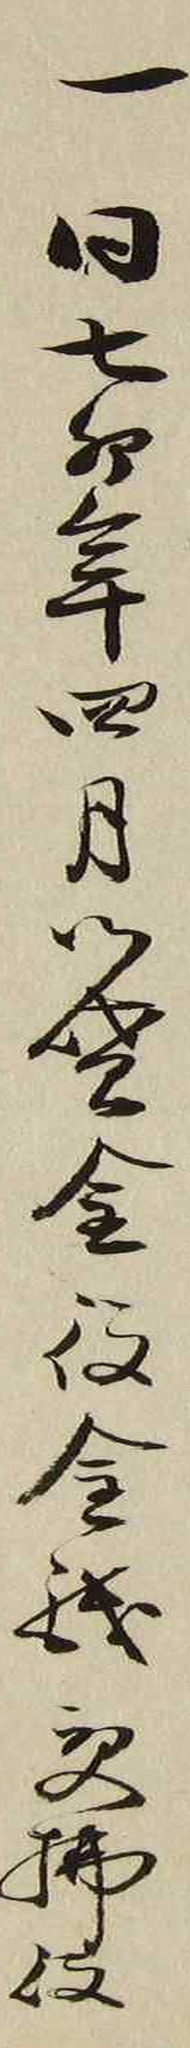一同七卯年四月御貸金役金銭受払役
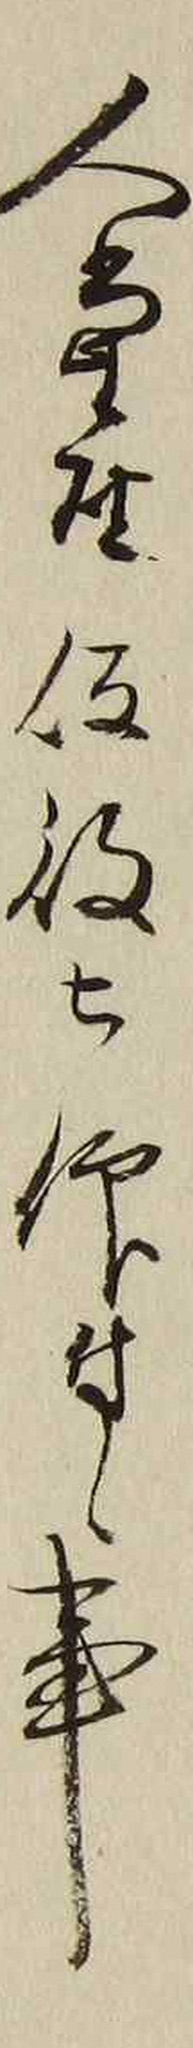人当座仮役被仰付候事
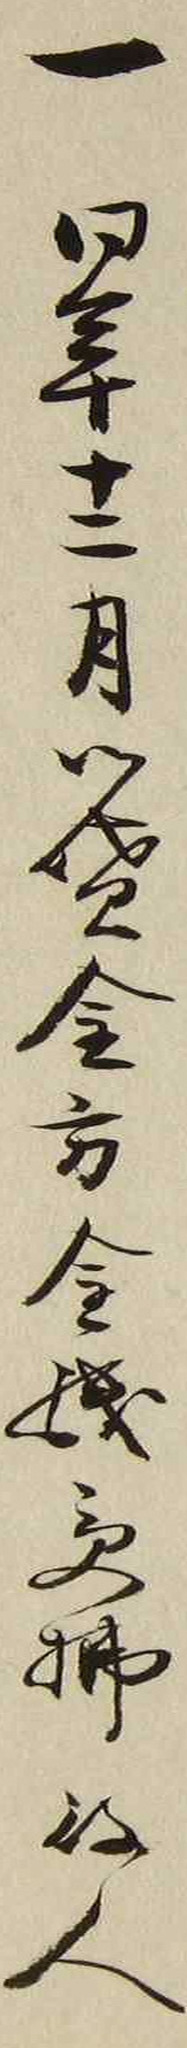一同年十二月御貸金方金銭受払役人
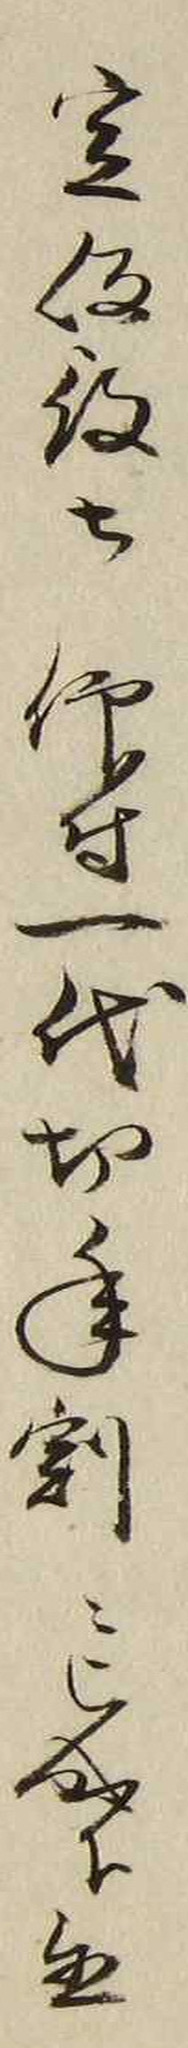定仮役被仰付一代切年割ニ被成下置

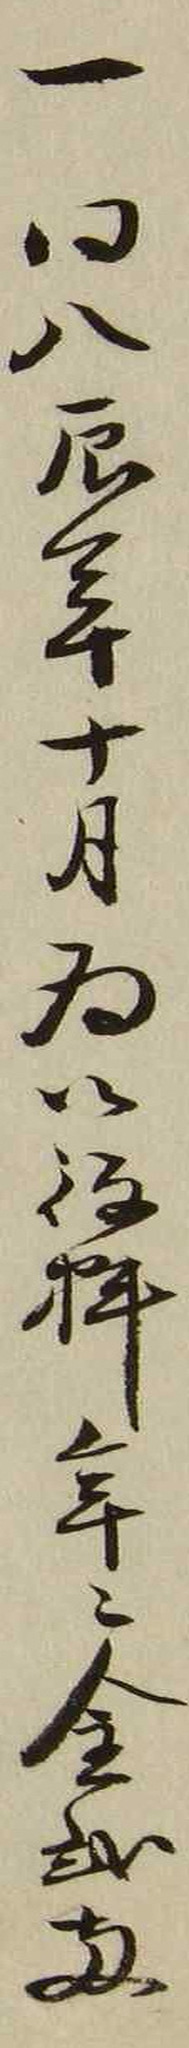一同八辰年十月為御役料年ニ金弐両
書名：諸士系譜　巻之291　さ之部23
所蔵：会津若松市立会津図書館
